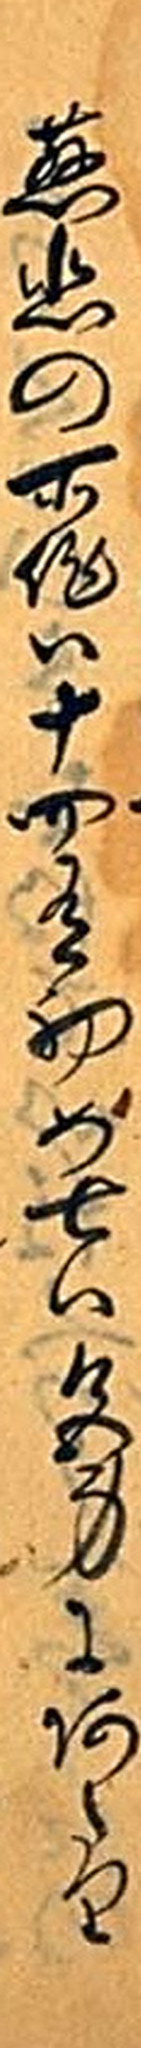慈悲の所作は十四有初め七は色身にあたり
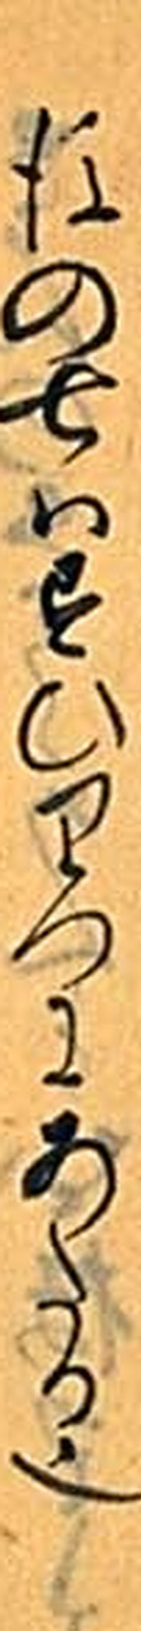後の七はすひりつにあたる也
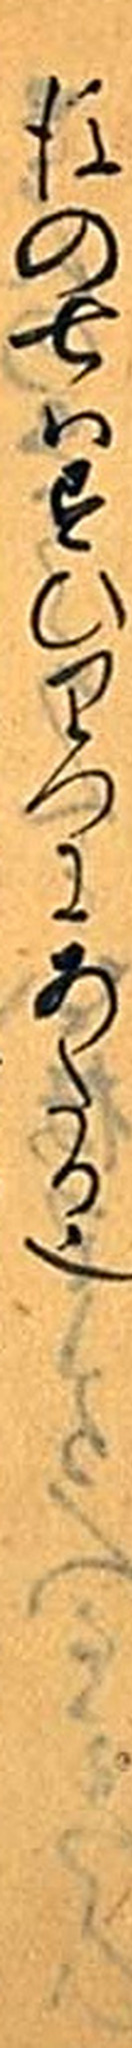後の七はすひりつにあたる也
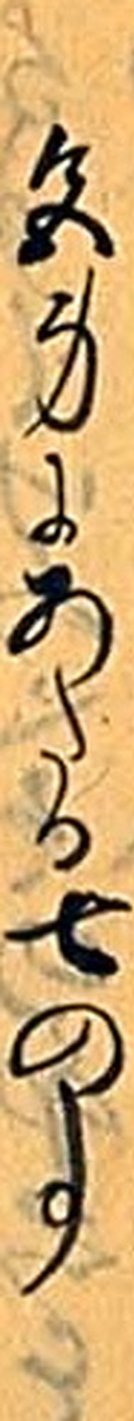色身にあたる七の事
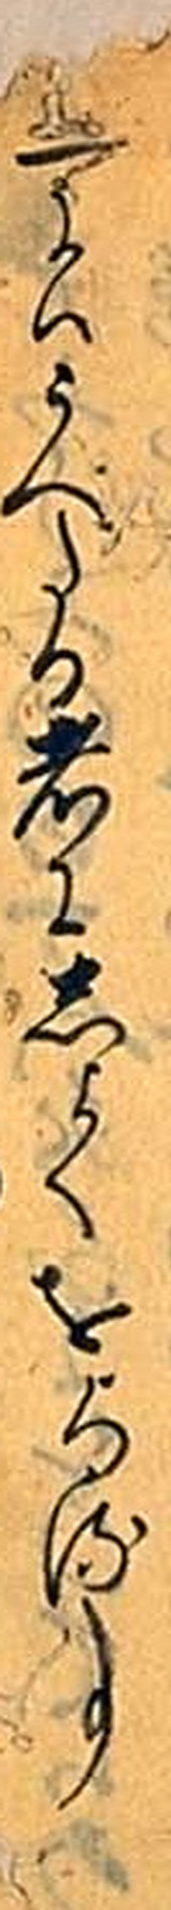一にはこんたる者にしよくを与る事
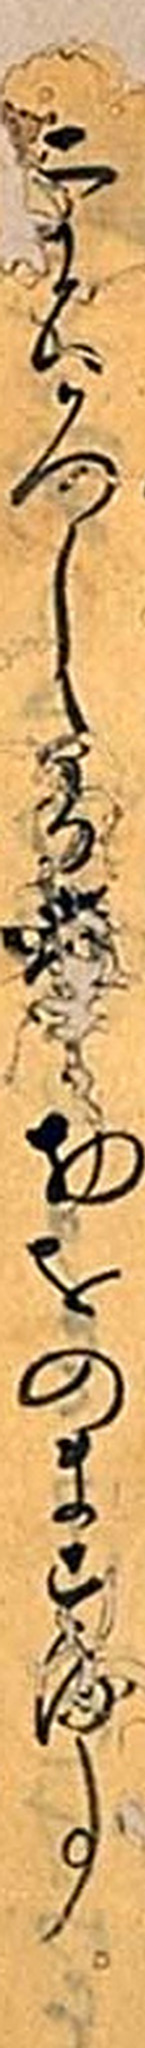二にはかつしたる物をのまする事
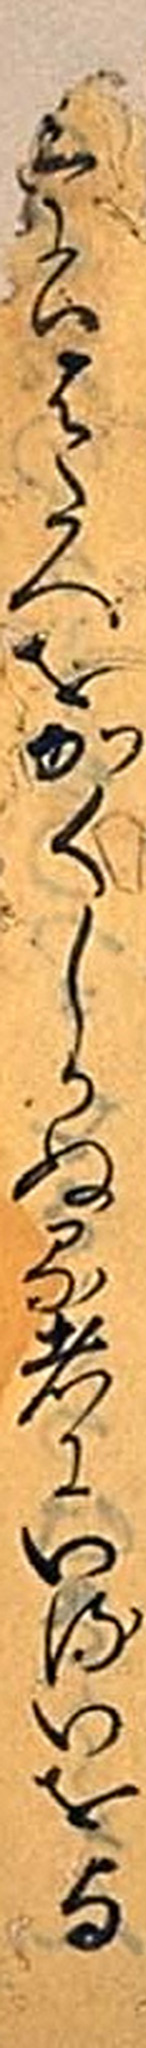三にははたへをかくしかぬる者にいるいを与
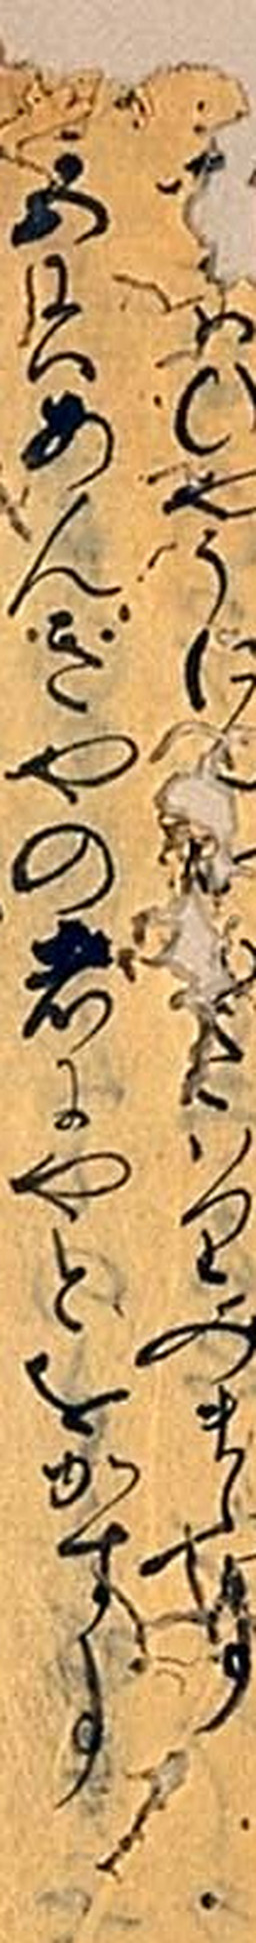五にはあんぎやの者にやとをかす事
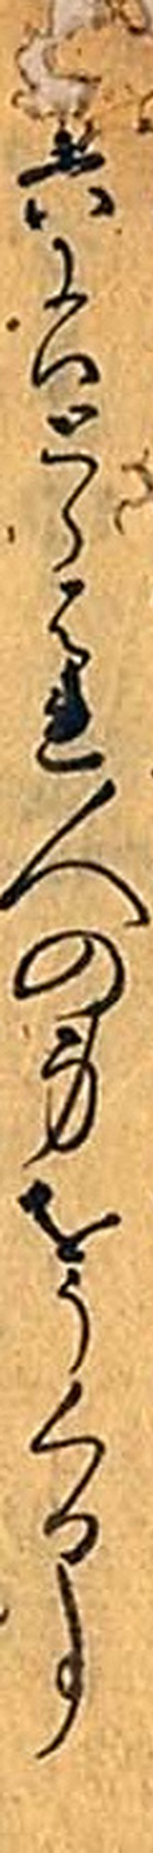六にはとらはれ人の身をうくる事
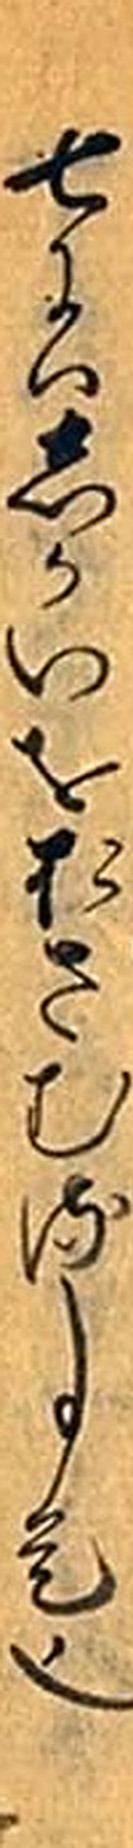七にはしかいをおさむる事是也
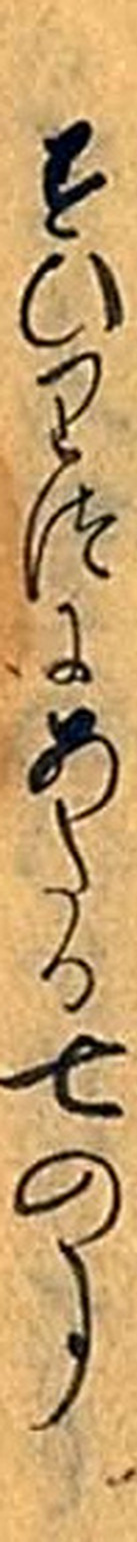すひりつにあたる七の事
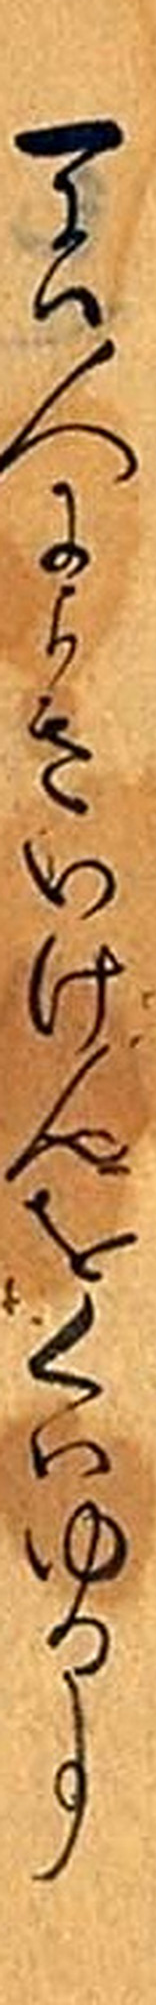一には人によきいけんをくはゆる事
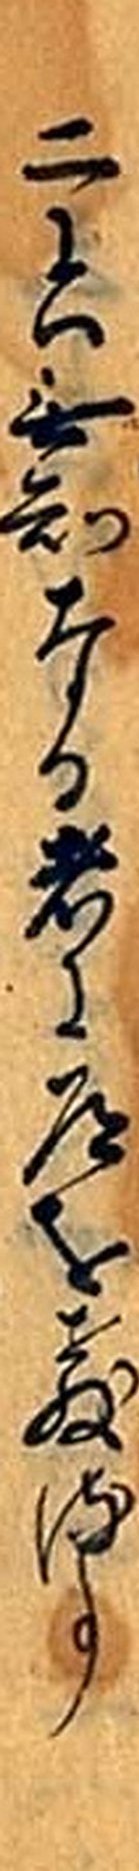二には無知なる者に道を教る事
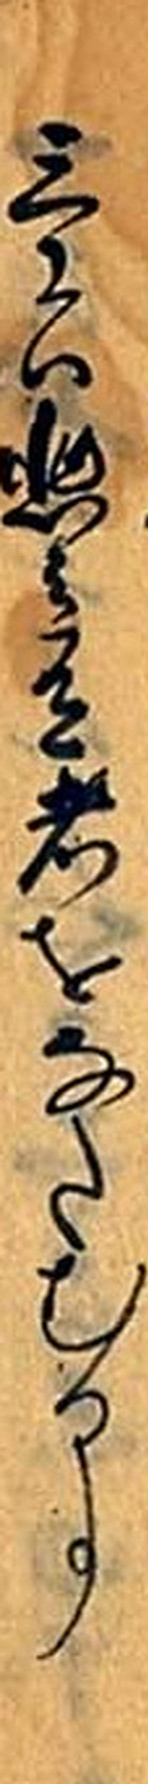三には悲み有者をなたむる事
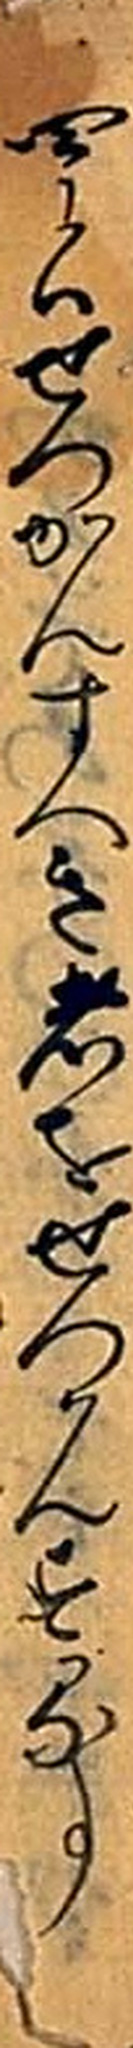四にはせつかんすへき者をせつかんする事
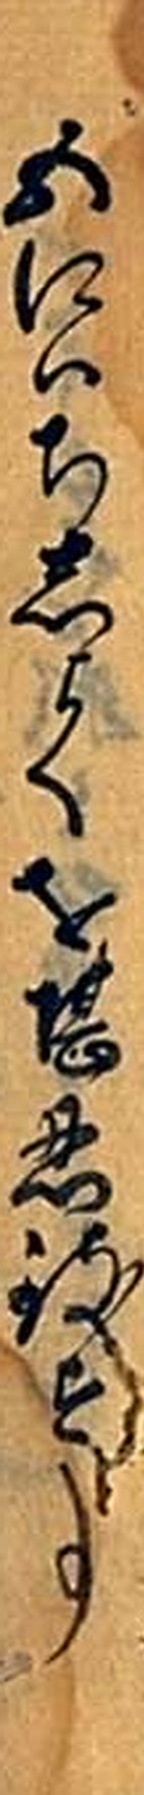五にはちしよくを堪忍致す事
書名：ドチリナ・キリシタン
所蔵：東京大学総合図書館 / General Library in the University of Tokyo
